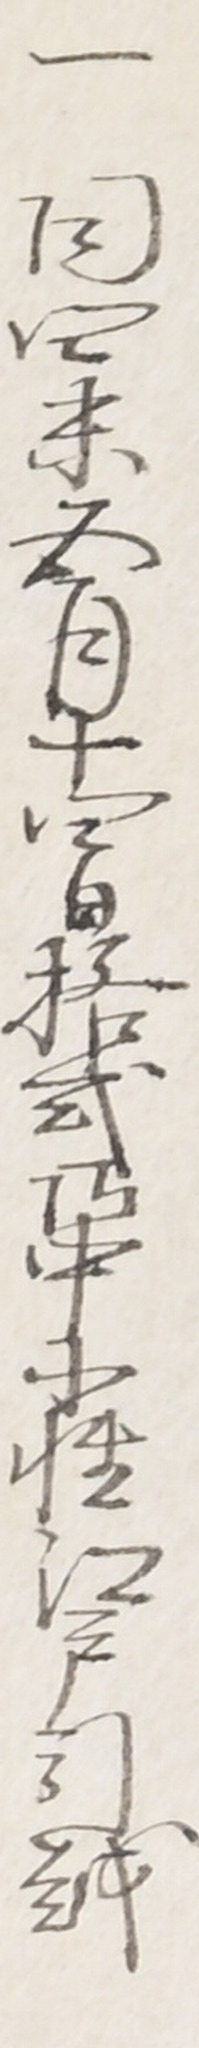一同四未五月十四日格式御中小性江戸引越
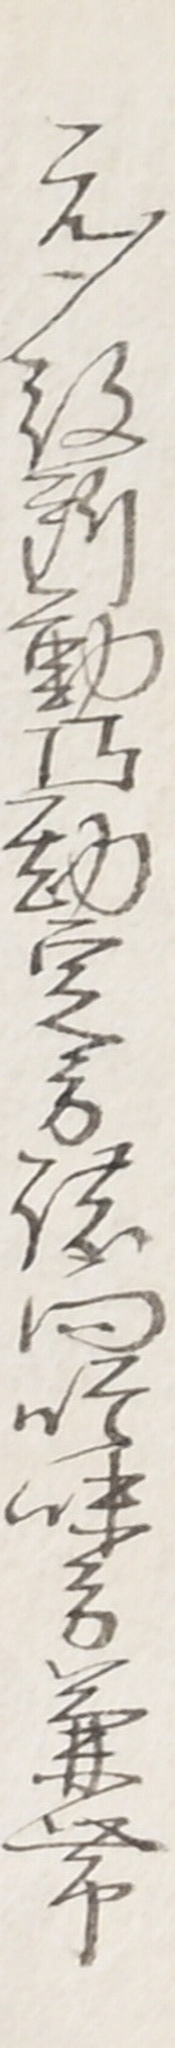元〆役所勤御勘定方諸向吟味方兼帯
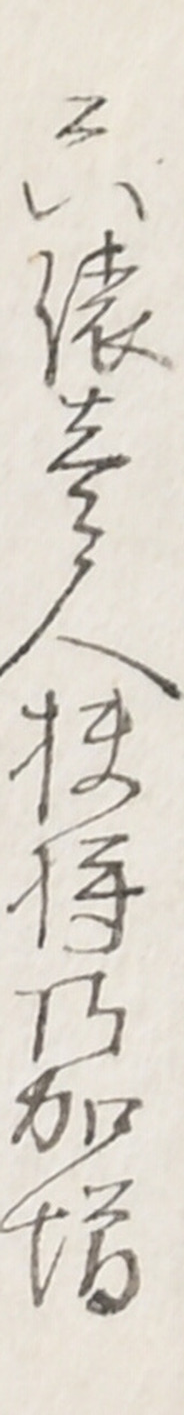六俵壱人扶持御加増
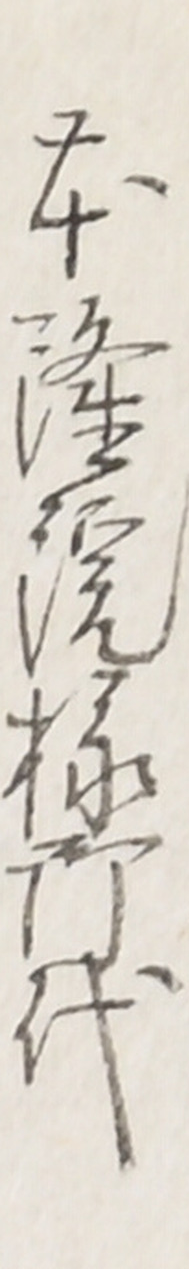本隆院様御代
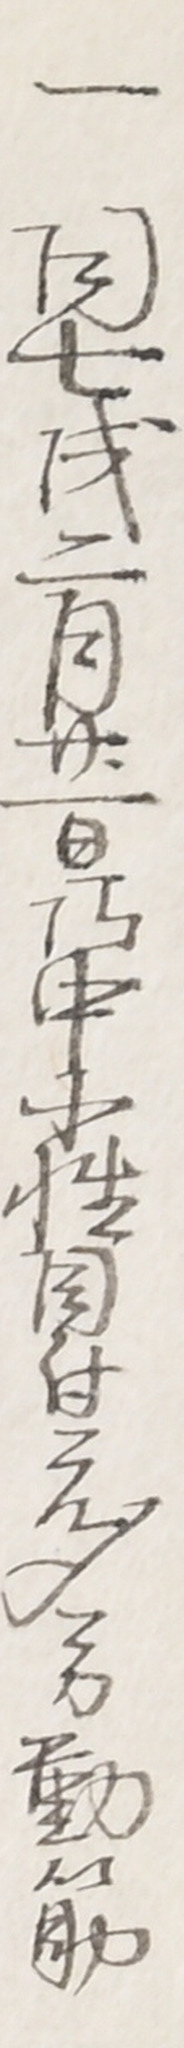一同七戌二月廿一日御中小性目付元〆方勤筋
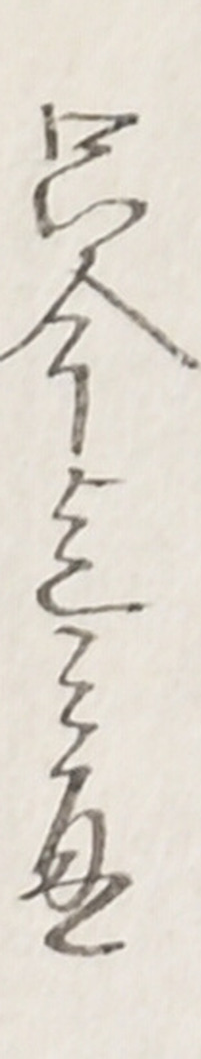只今迄之通
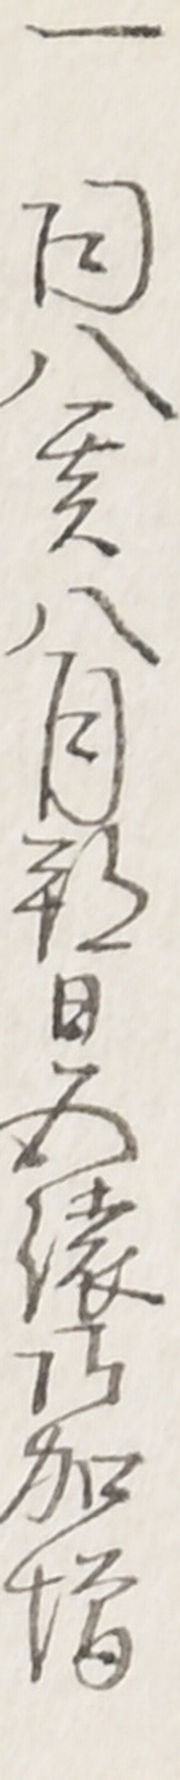一同八亥八月朔日五俵御加増
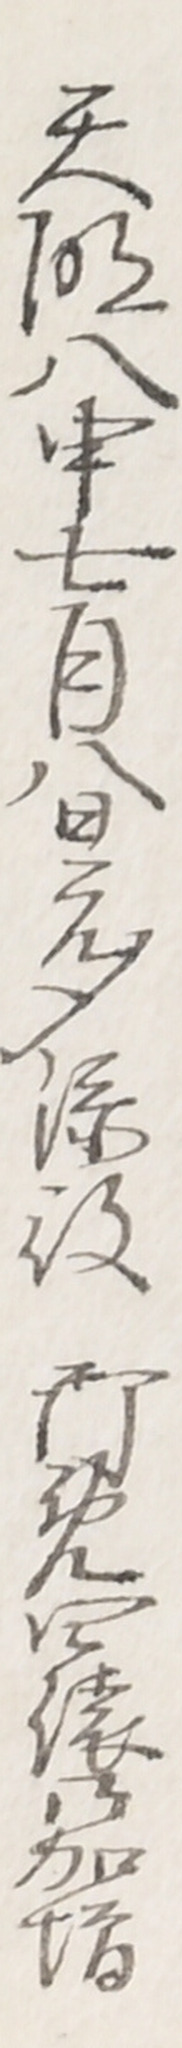一天明八申七月八日元〆添役御免四俵御加増
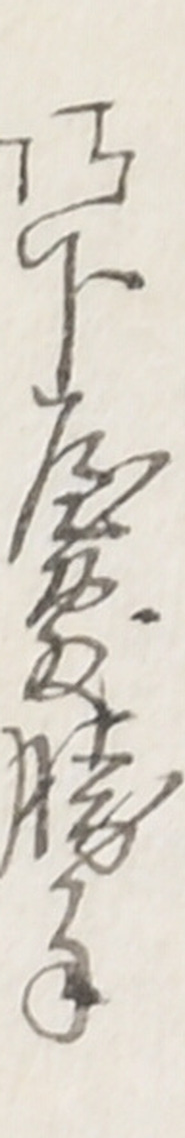御下屋敷勝手
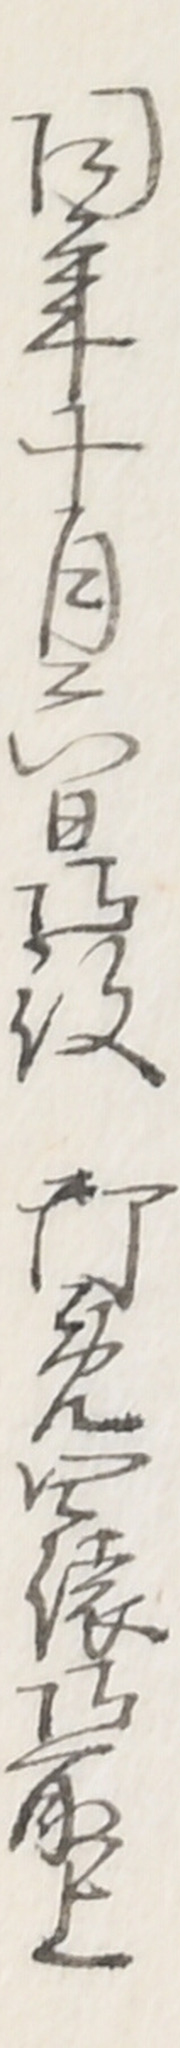一同年十月六日御役御免四俵御取上
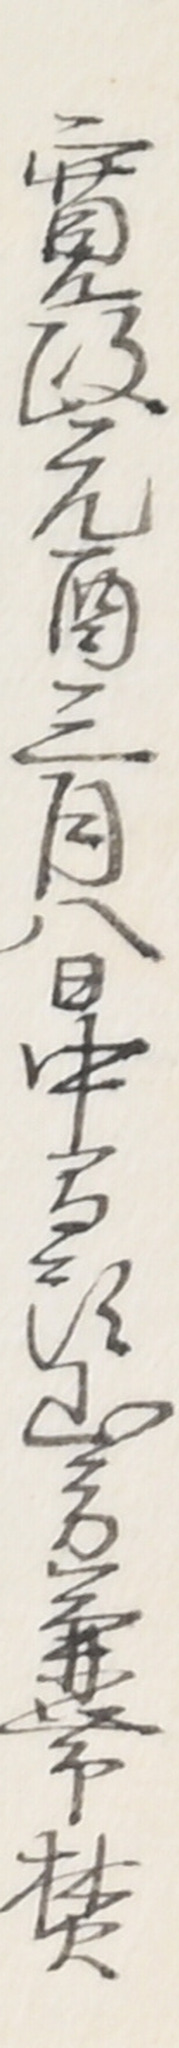一寛政元酉三月八日中間頭山方兼帯焚
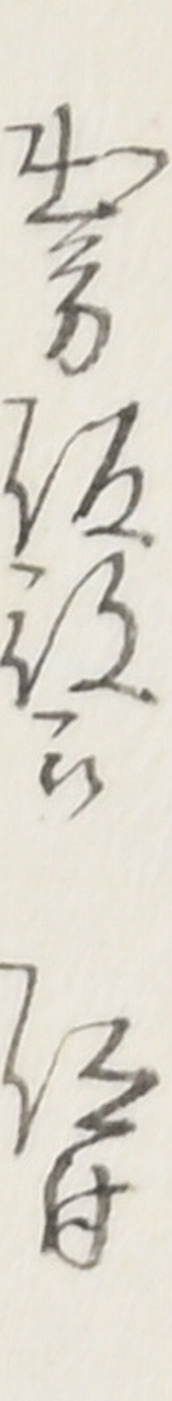出方仮役被仰付
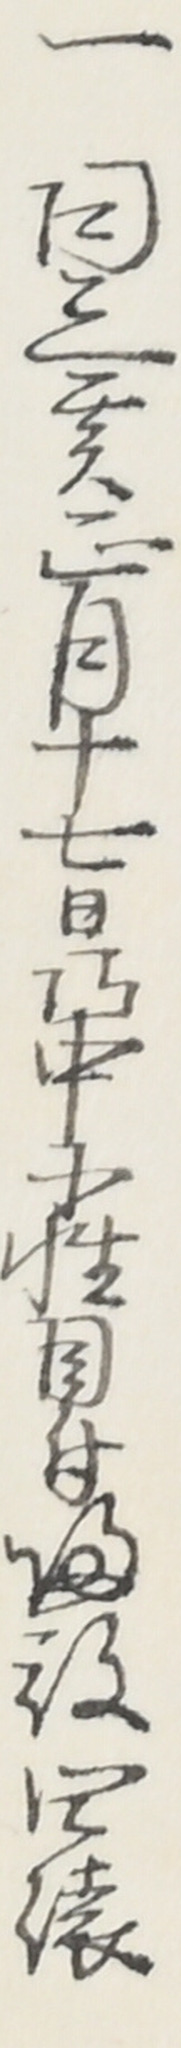一同三亥正月十七日御中小性目付帰役四俵
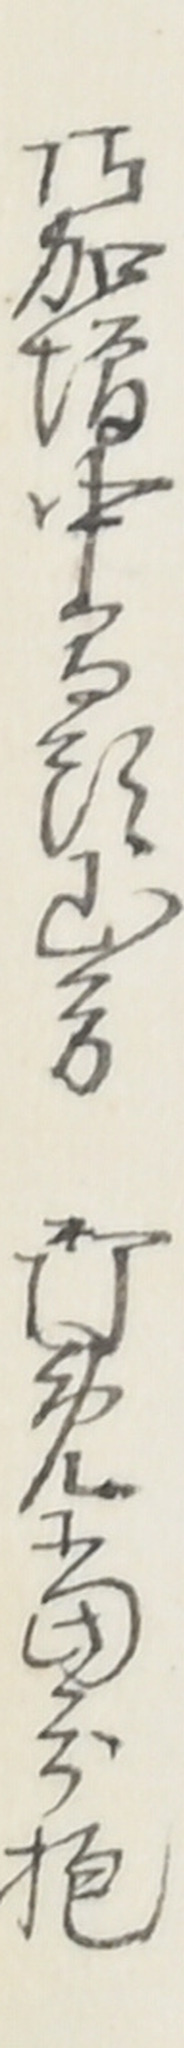御加増中間頭山方御免当分抱
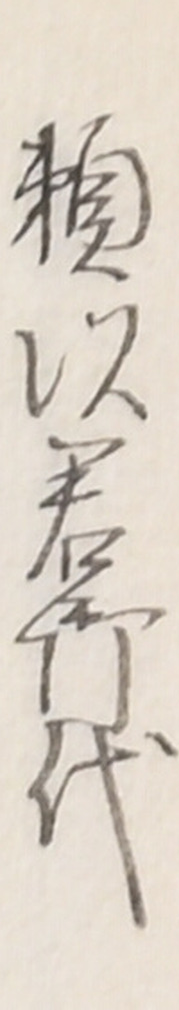頼以君御代
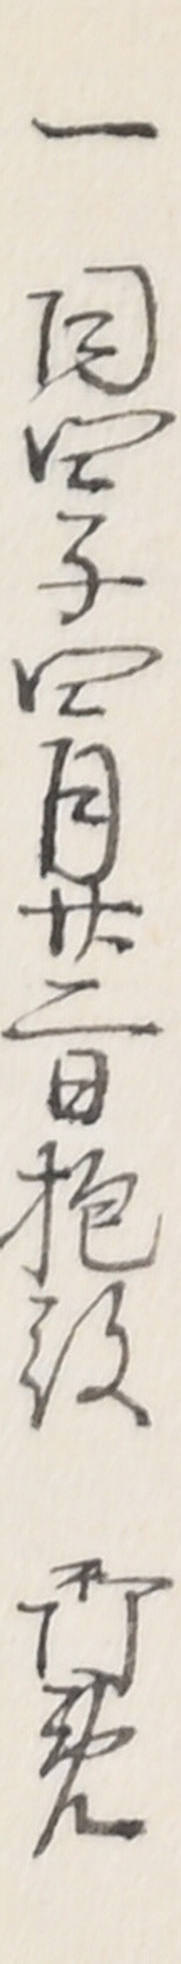一同四子四月廿二日抱役御免
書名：無足諸士勤仕録（四）
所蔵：伊那市立高遠町図書館・合同会社AMANE
